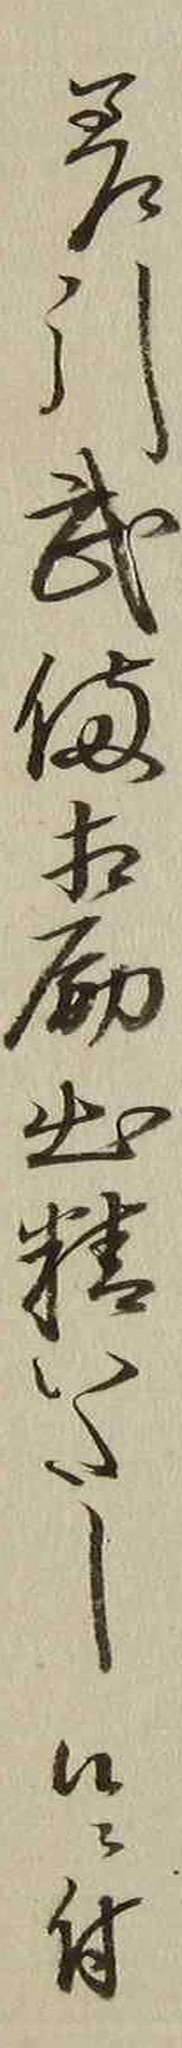差引武備相励出精いたし候に付
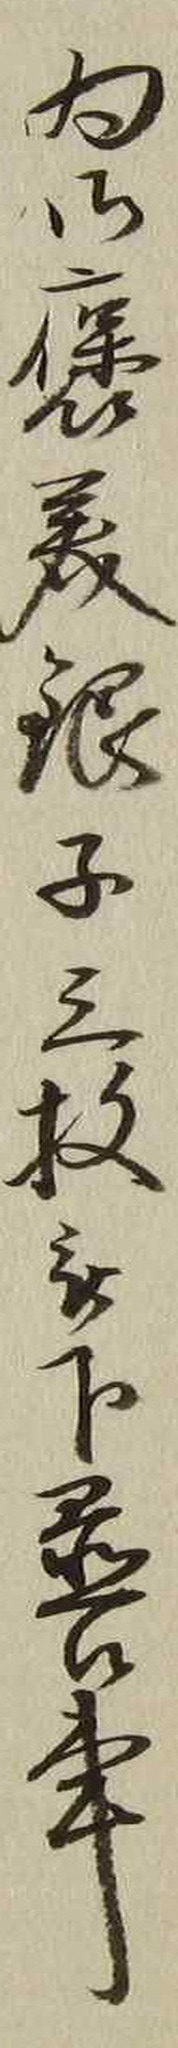為御褒美銀子三枚被下置候事
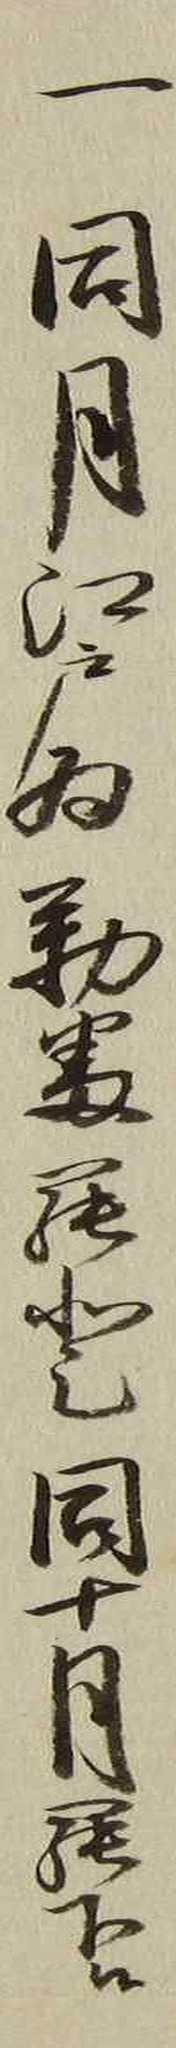一同月江戸為勤番罷登同十月罷下候
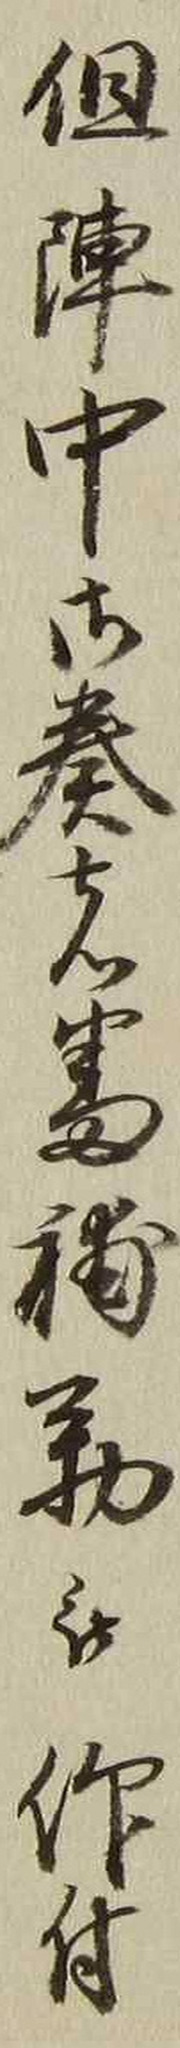但陣中御奏者番補勤被仰付
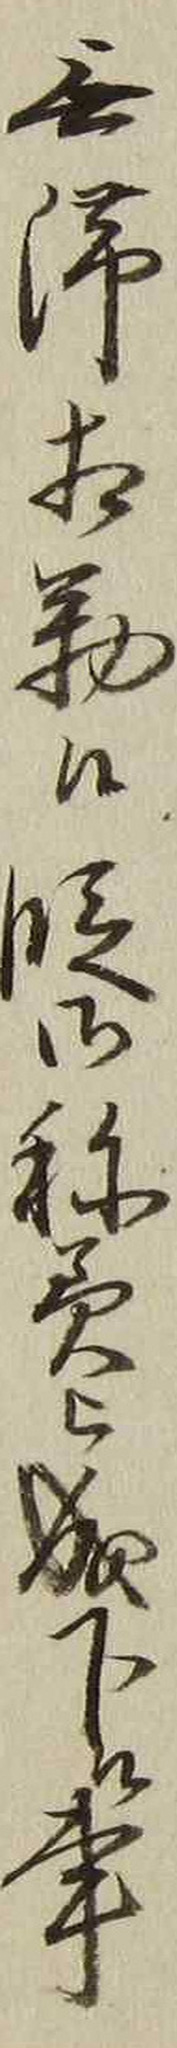無滞相勤候段御称美被成下候事
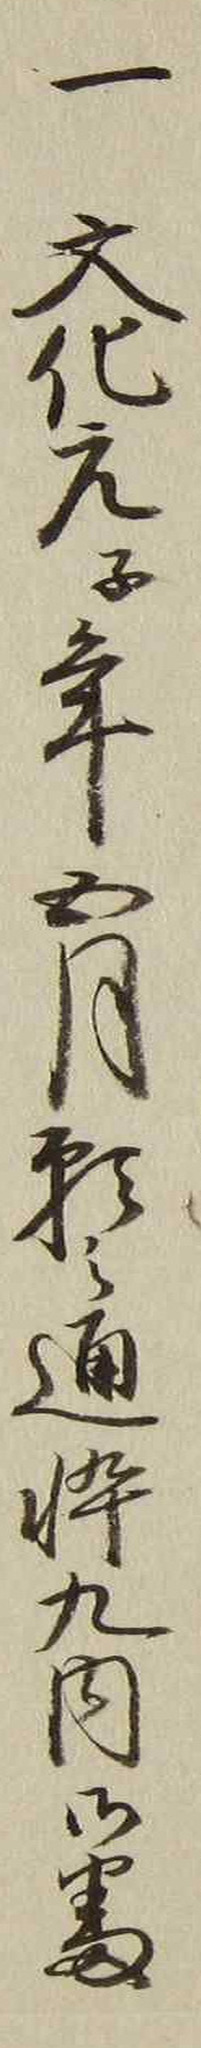一大化元子年五月願之通忰九内御番
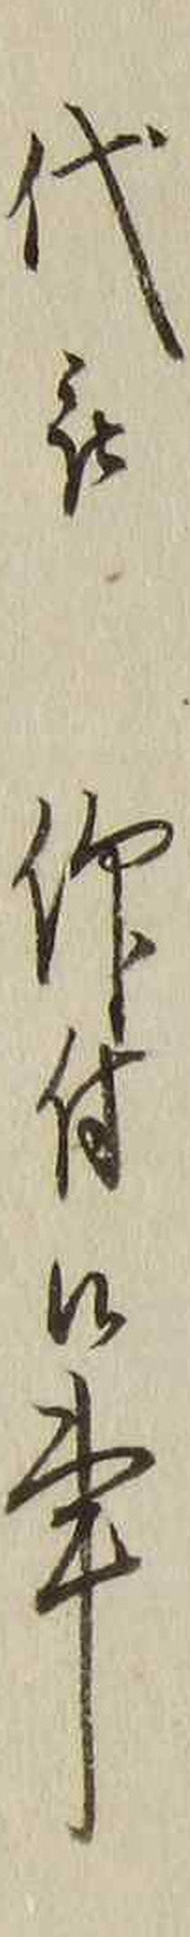代被仰付候事
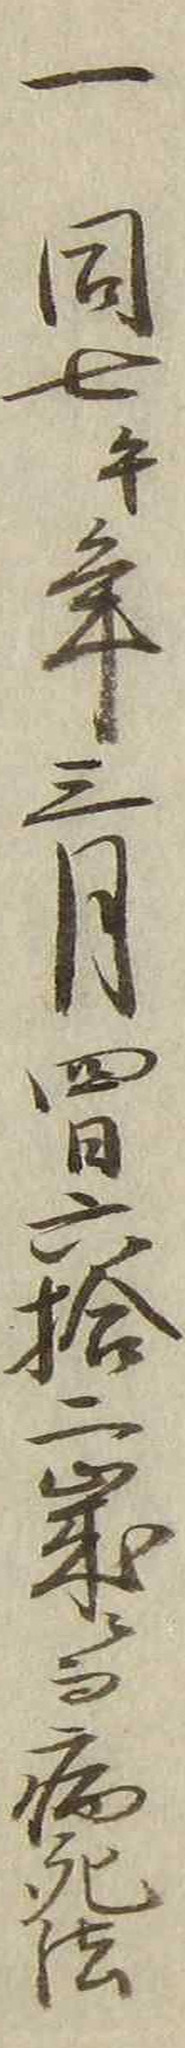一同七午年三月四日六拾二歳に而病死法

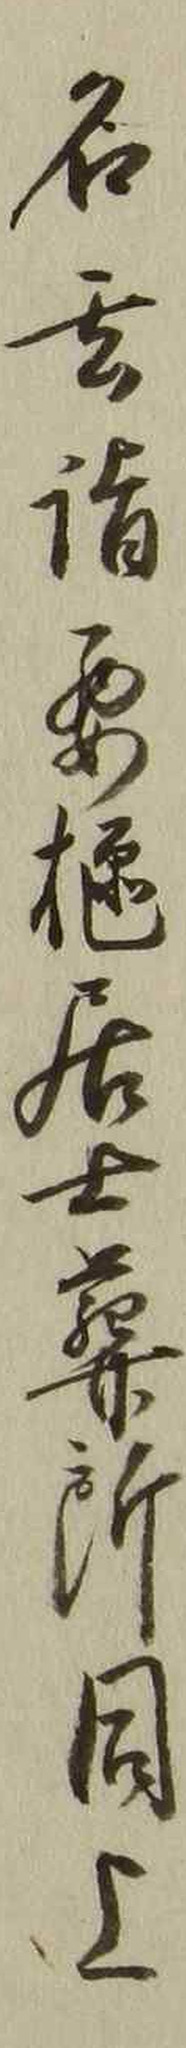名玄詣要榧居士葬所同上
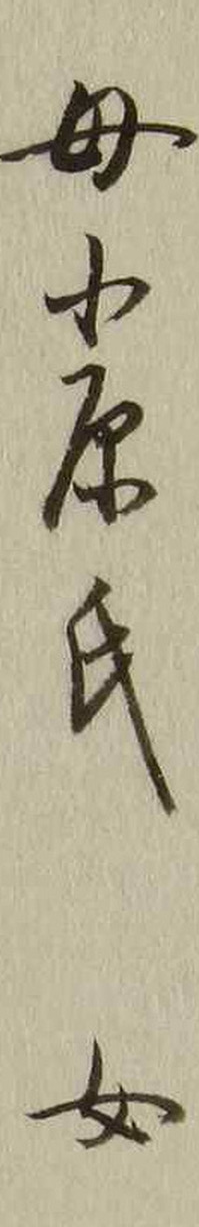母小原氏女
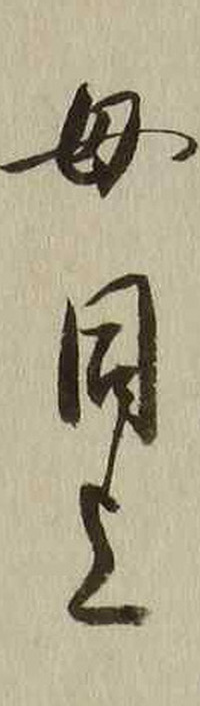母同上
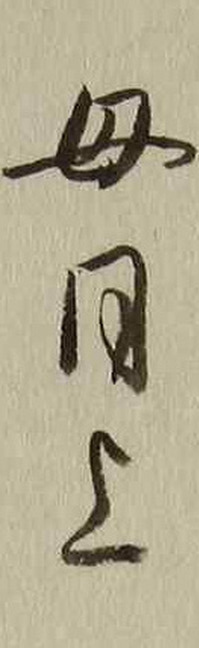母同上
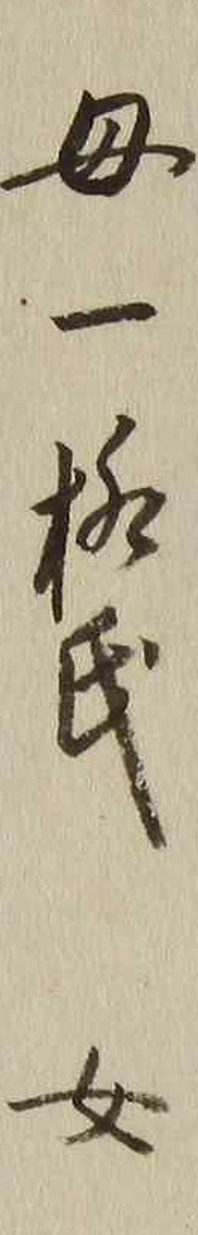母一格氏女
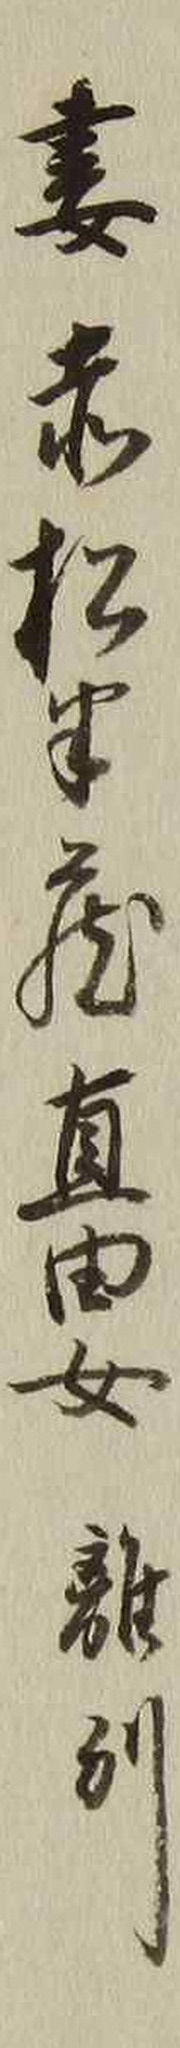妻赤松半蔵直由女離別
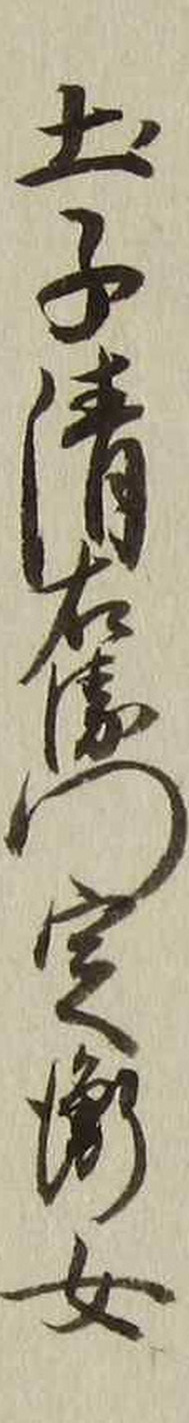土子清右衛門定衛女
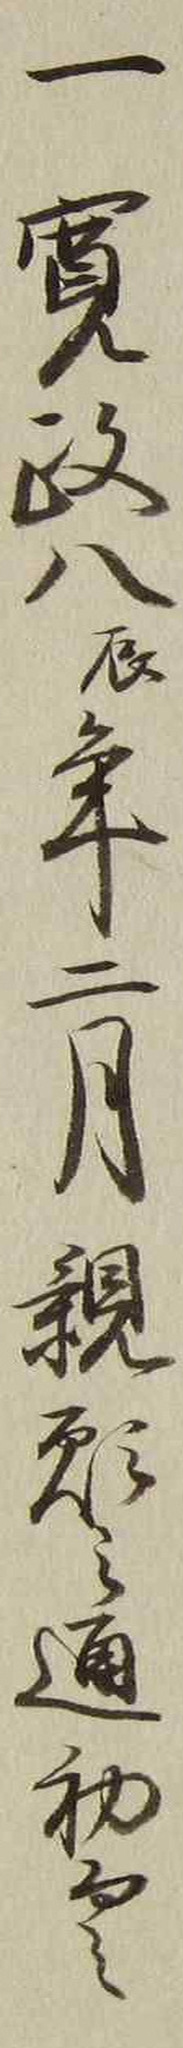一寛政八辰年二月親願之通初而之
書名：諸士系譜　巻之133　た之部9
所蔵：会津若松市立会津図書館
